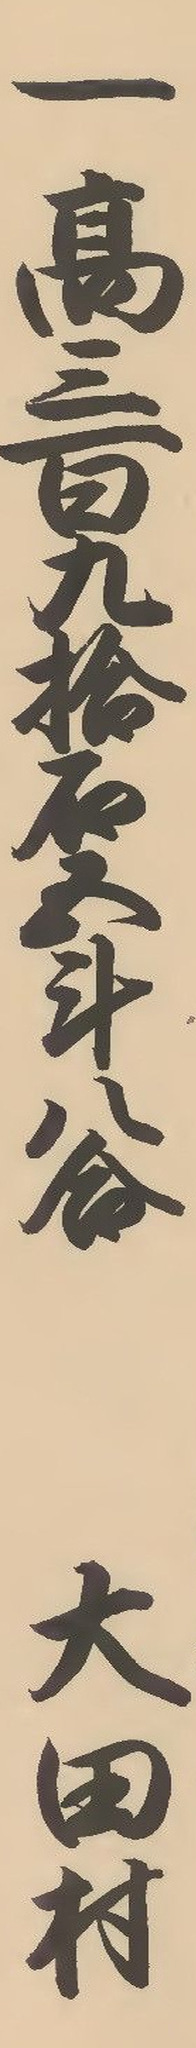一髙三百九拾石五斗八合大田村
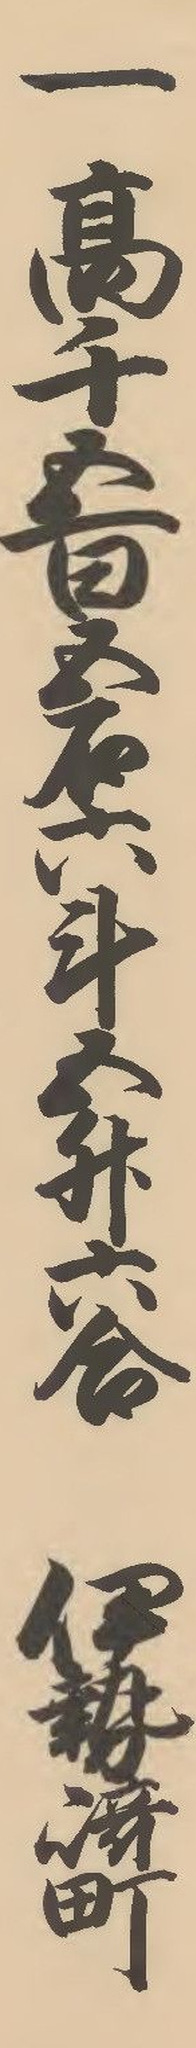一髙千五百五石六斗五升六合伊勢崎町
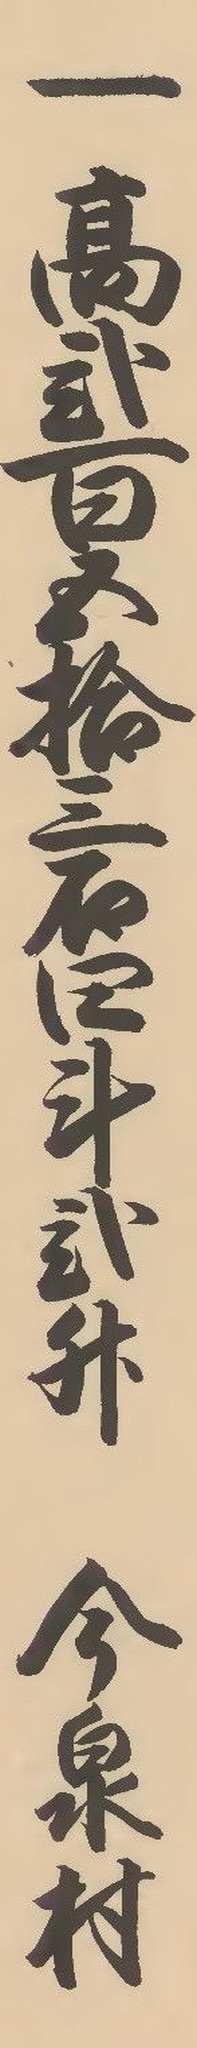一髙弐百五拾三石四斗弐升今泉村

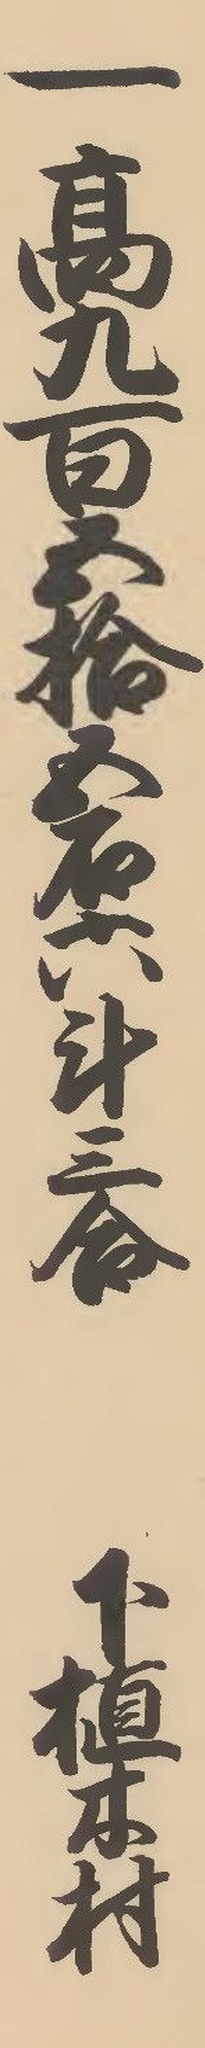一髙九百五拾五石六升三合下植木村
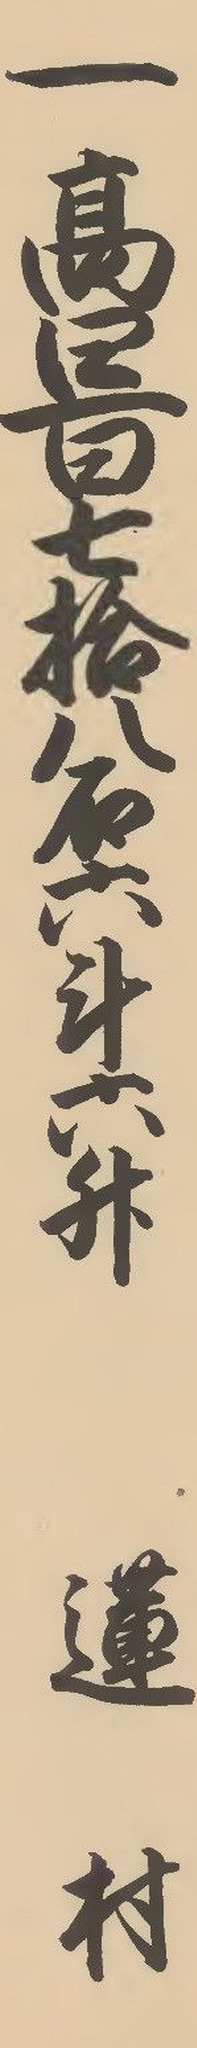一髙四百七拾八石六斗六升蓮村
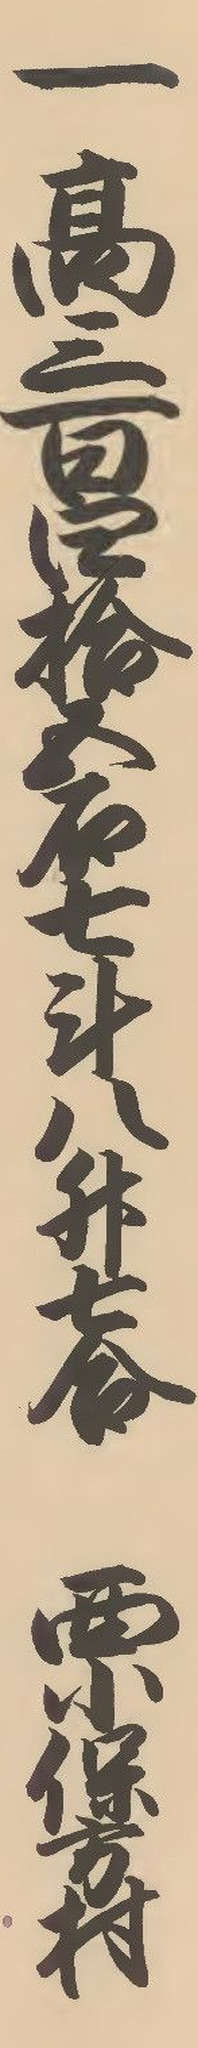一髙三百四拾五石七斗八升七合西小保方村
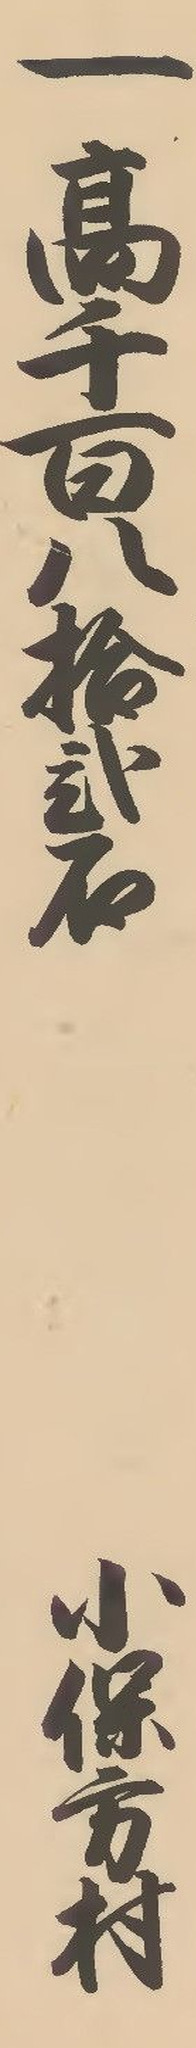一髙千百八拾弐石小保方村
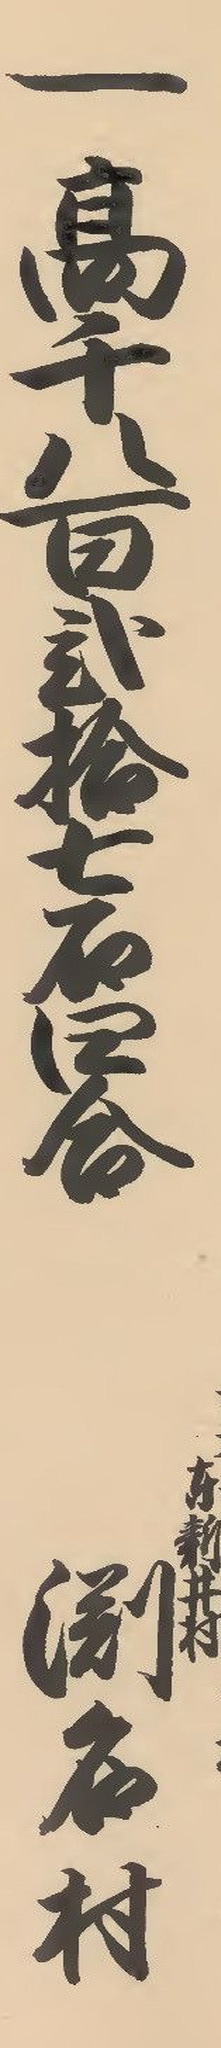一髙千八百弐拾七石四合渕名村
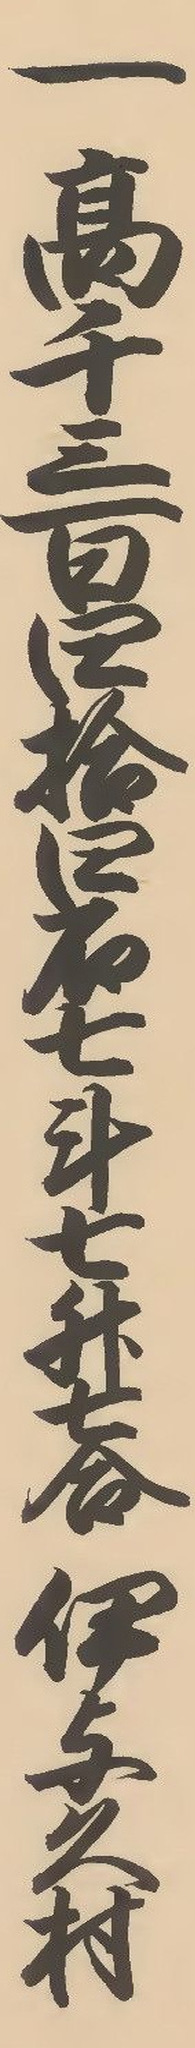一髙千三百四拾四石七斗七升七合伊与久村
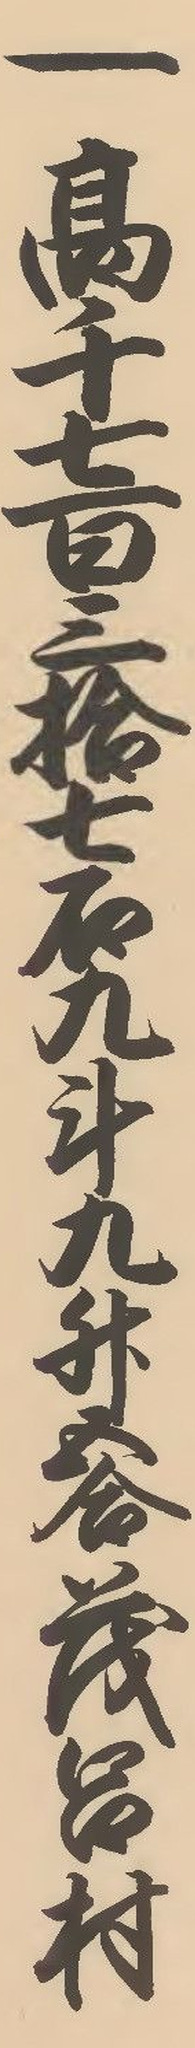一髙千七百三拾七石九斗九升五合茂呂村

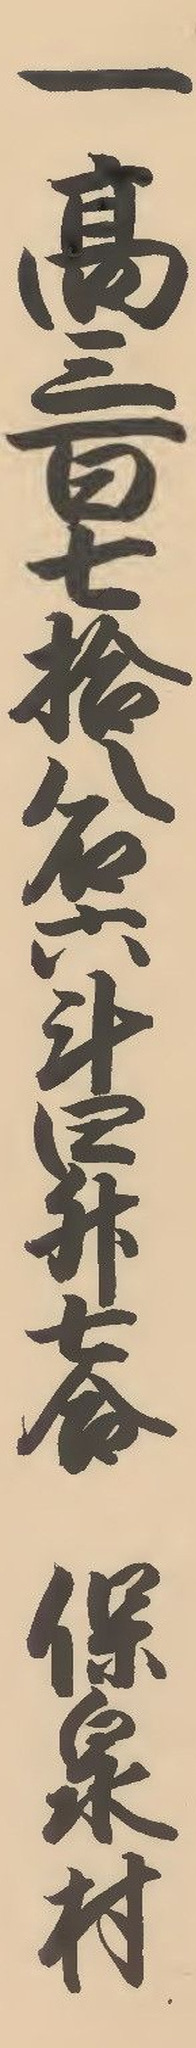一髙三百七拾八石六斗四升七合保泉村
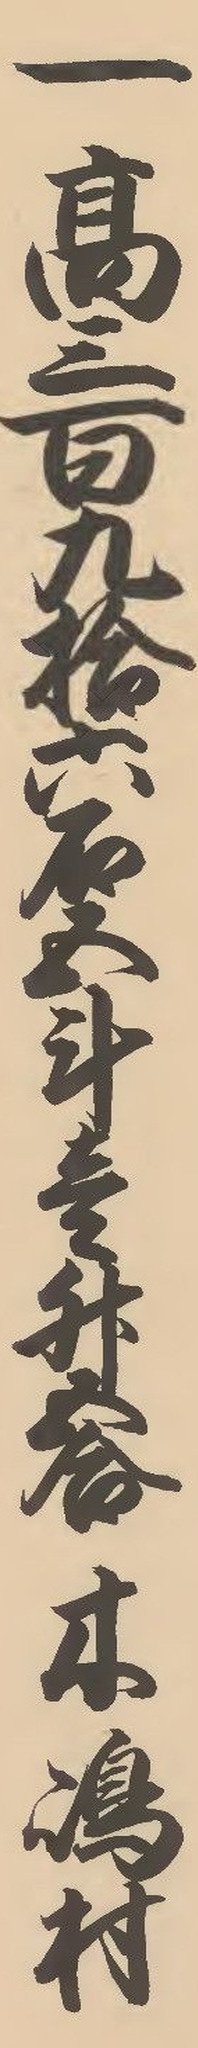一髙三百九拾六石五斗壱升五合木嶋村
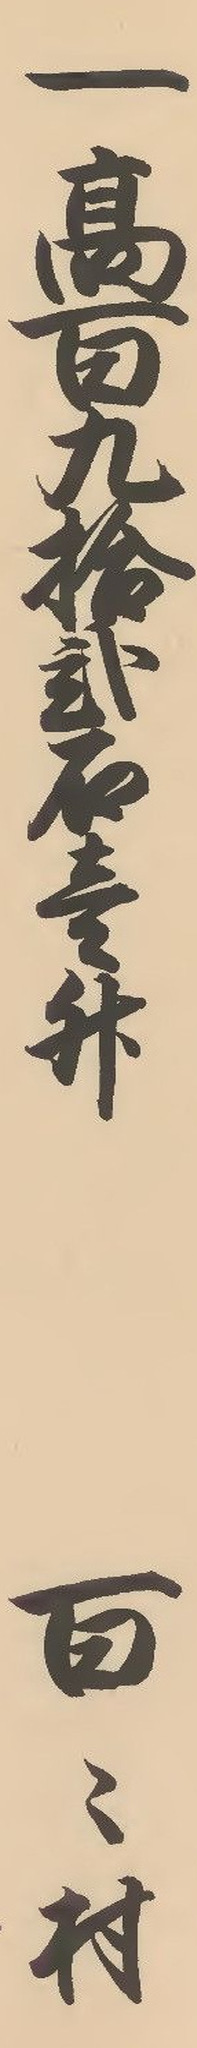一髙百九弐石壱升百々村
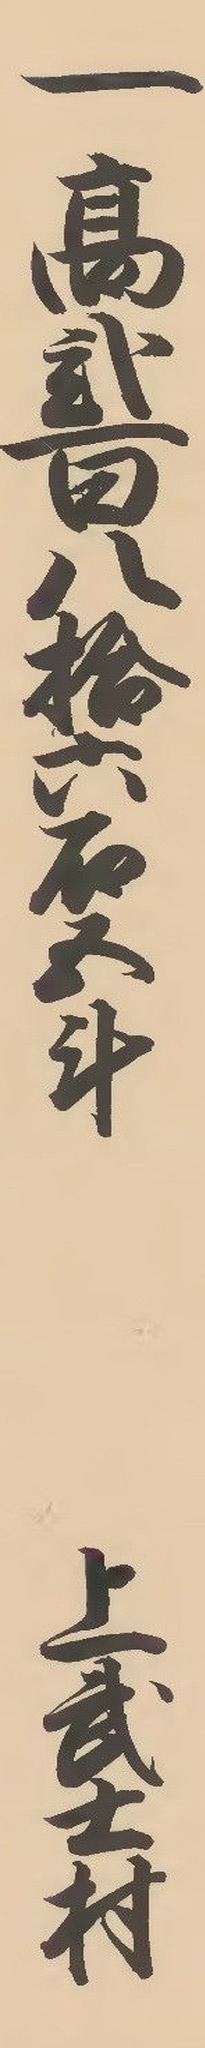一髙弐百八拾六石五斗上武士村
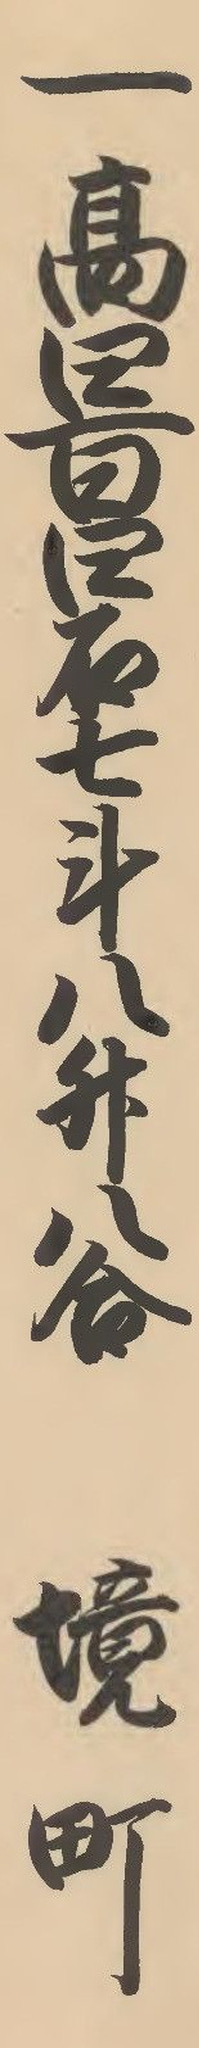一髙四百四石七斗八升八合境町
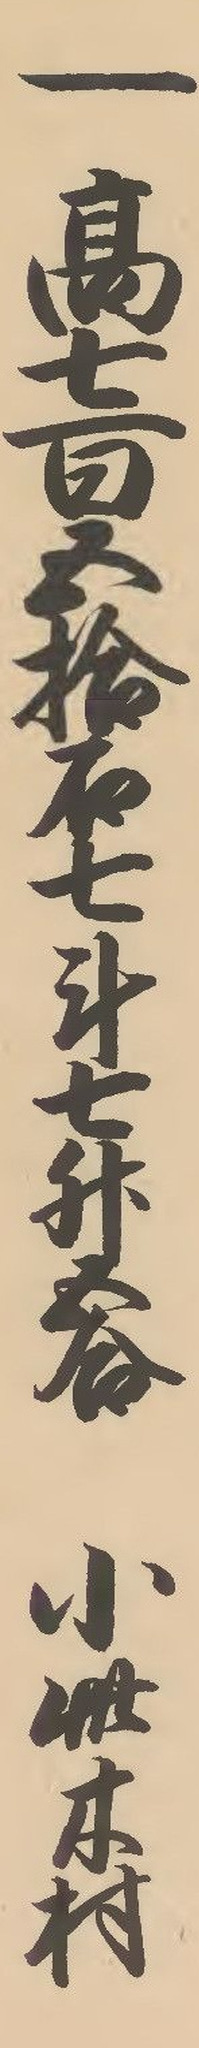一髙七百五拾石七斗七升五合小此木村
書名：上野国郷帳
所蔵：国立公文書館 National Archives of Japan
